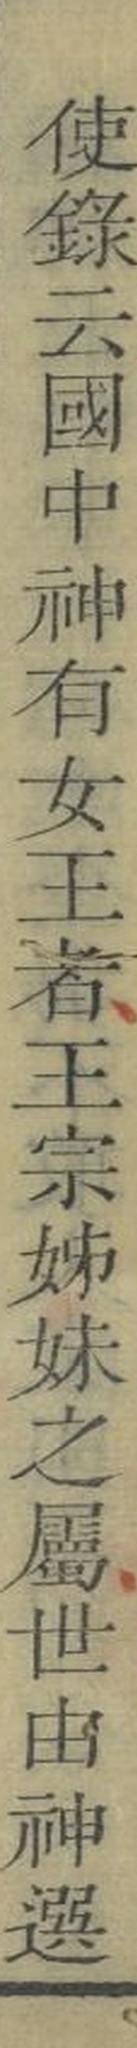使録云国中神有女王者王宗姉妹之属世由神選
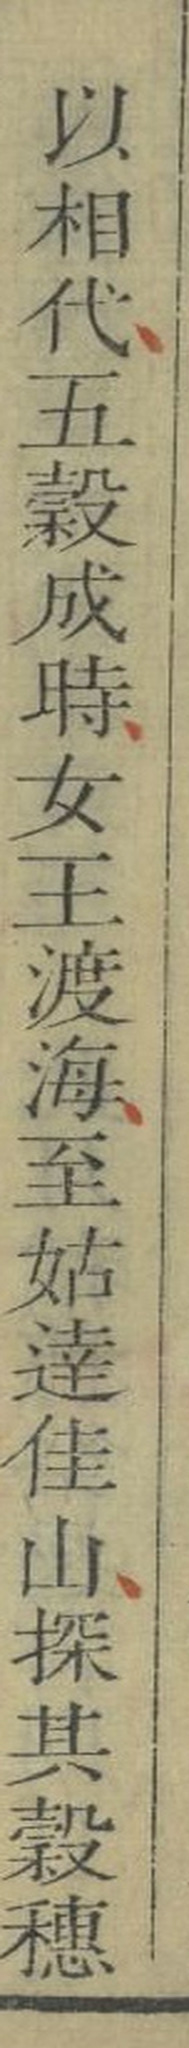以相代五穀成時女王渡海至姑達佳山探其穀穂
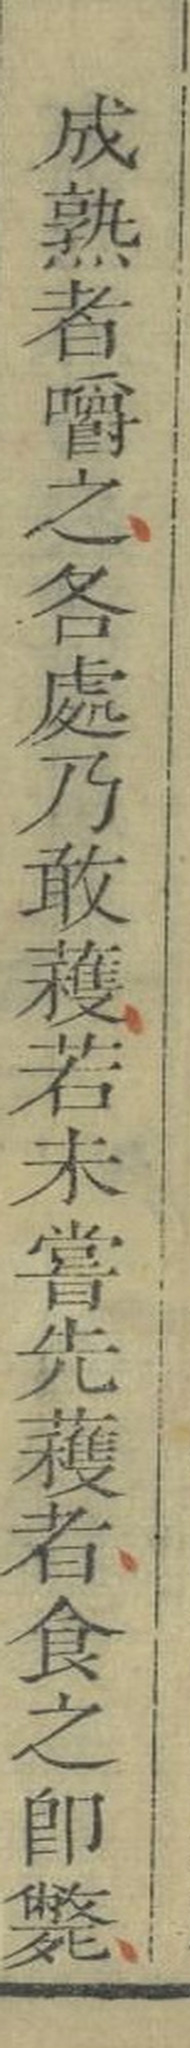成熟者嚼之各処乃敢穫若未嘗先穫者食之即斃
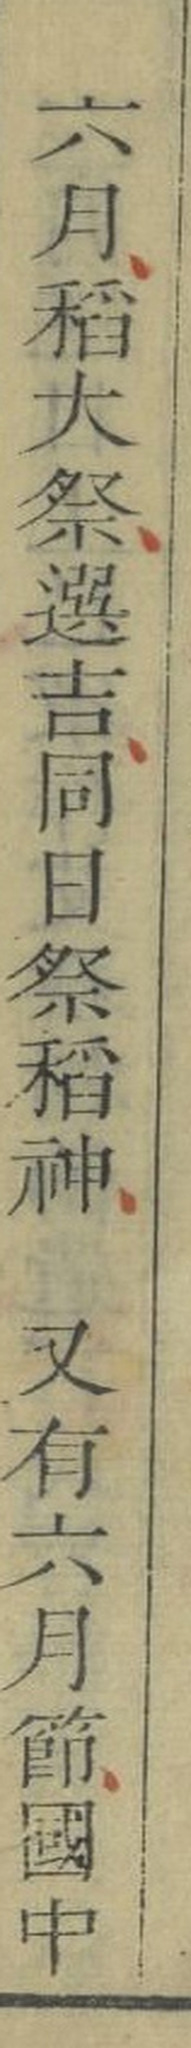六月稲大祭選吉同日祭稲神又有六月節国中
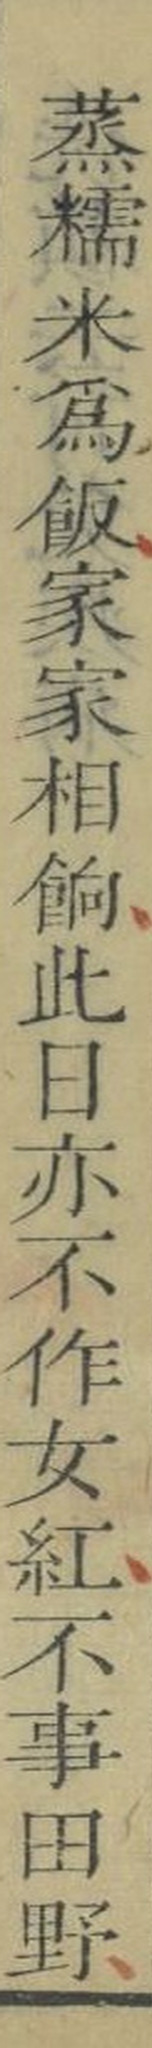蒸糯米為飯家家相餉此日亦不作女紅不事田野
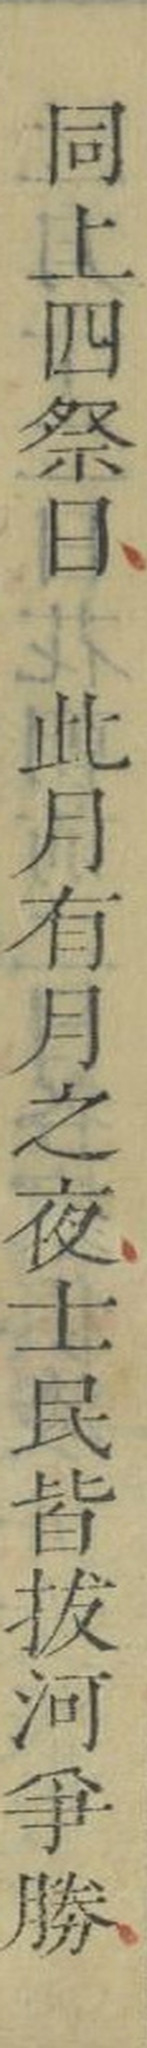同上四祭日此月有月之夜士民皆抜河争勝
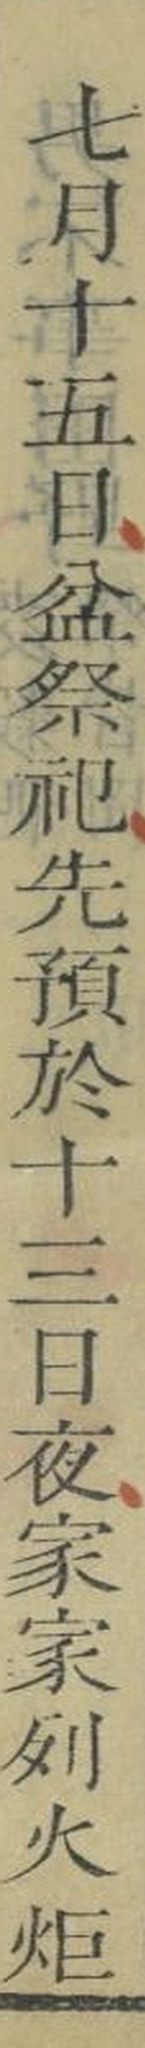七月十五日盆祭祀先預於十三日夜家家列火炬
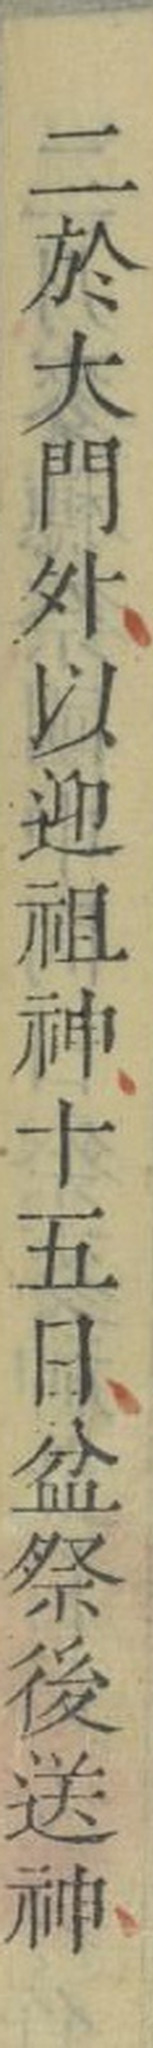二於大門外以迎祖神十五日盆祭後送神
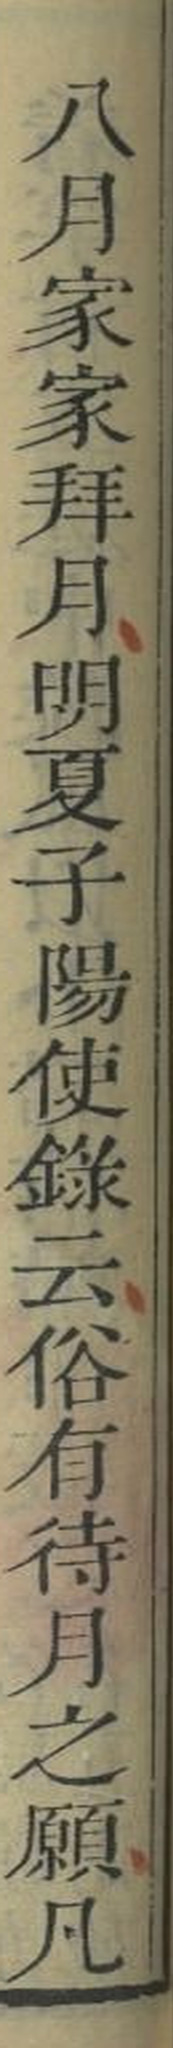八月家家拝月明夏子陽使録云俗有待月之願凡
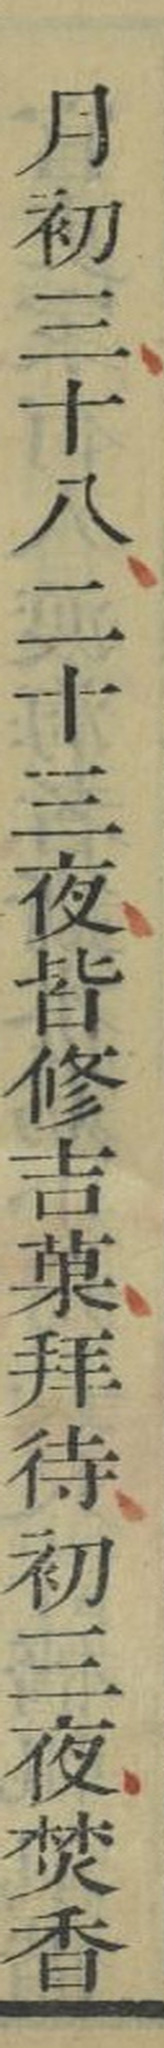月初三十八二十三夜皆修吉菓拝待初三夜焚香
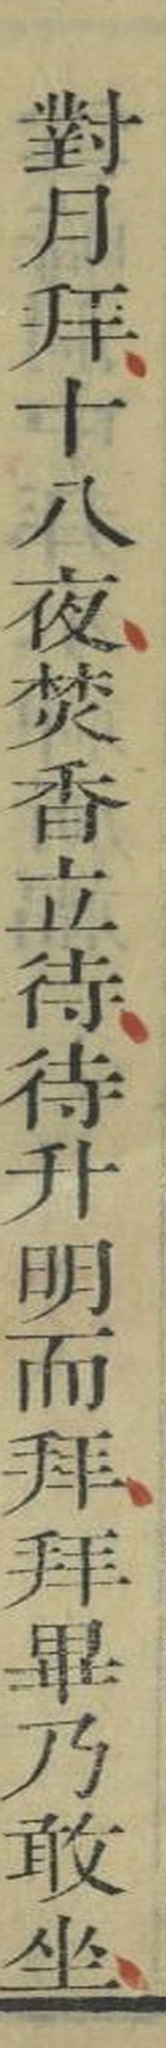対月拝十八夜焚香立待待升明而拝拝畢乃敢坐
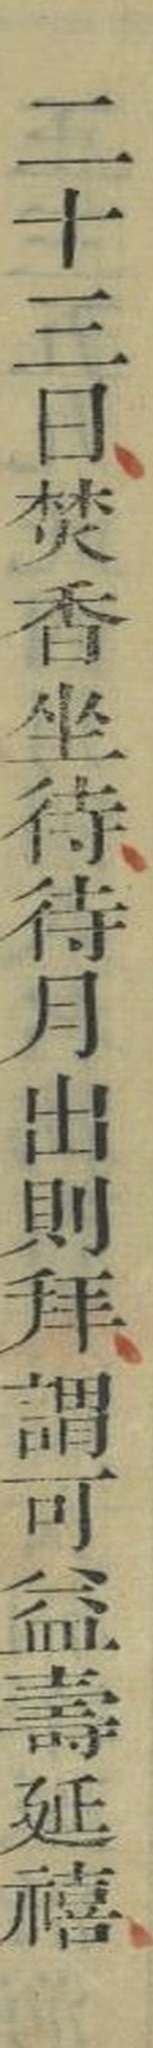二十三日焚香坐待待月出則拝謂可益寿延禧
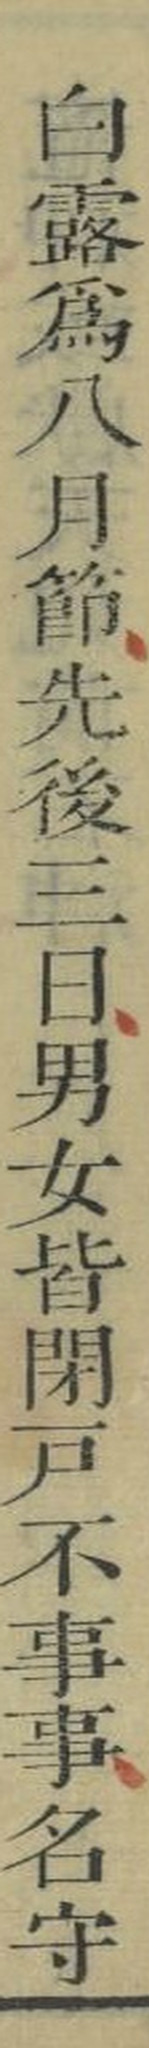白露為八月節先後三日男女皆閉戸不事事名守
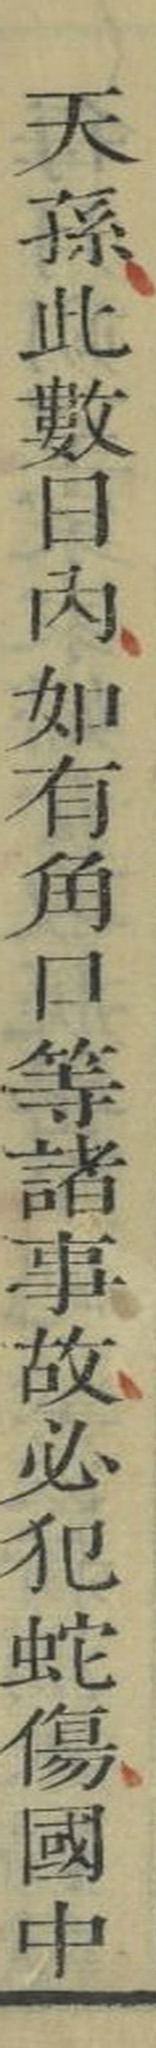天孫此数日内如有角口等諸事故必犯蛇傷国中
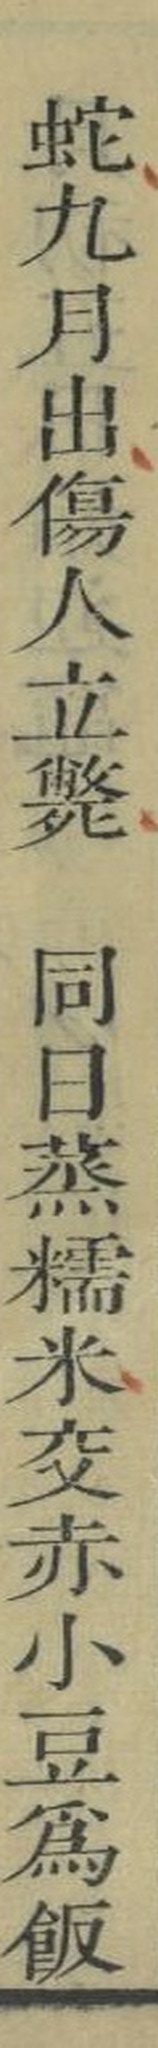蛇九月出傷人立斃同日蒸糯米交赤小豆為飯
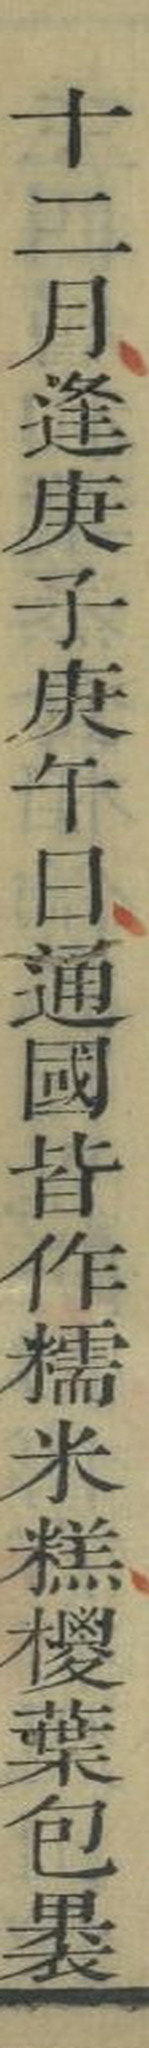十二月逢庚子庚午日通国皆作糯米糕棕葉包褁
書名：中山伝信録 巻六
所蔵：University of the Ryukyus Library
